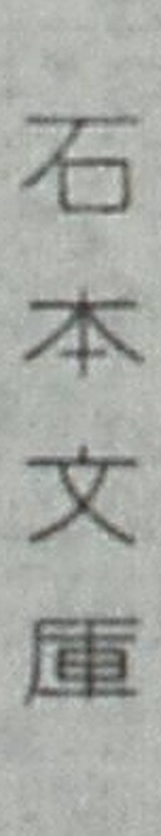石本文庫-

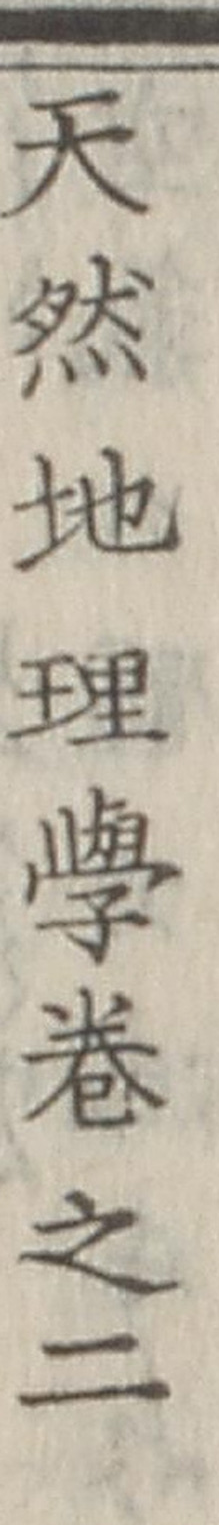天然地理学巻之二
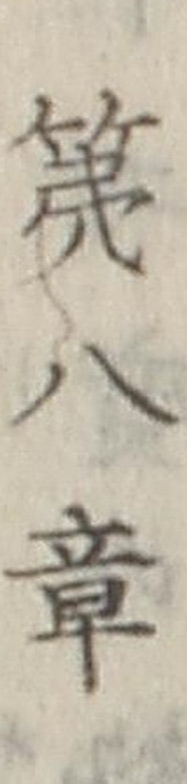第八章
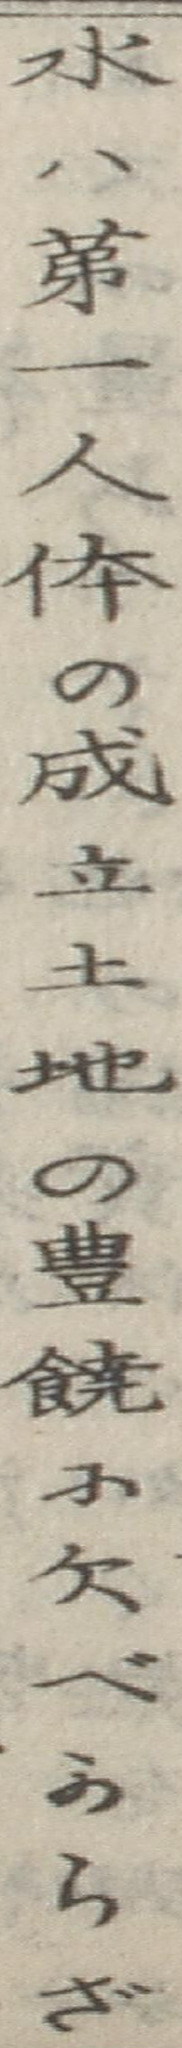水は第一人体の成立土地の豊饒に欠べからざ
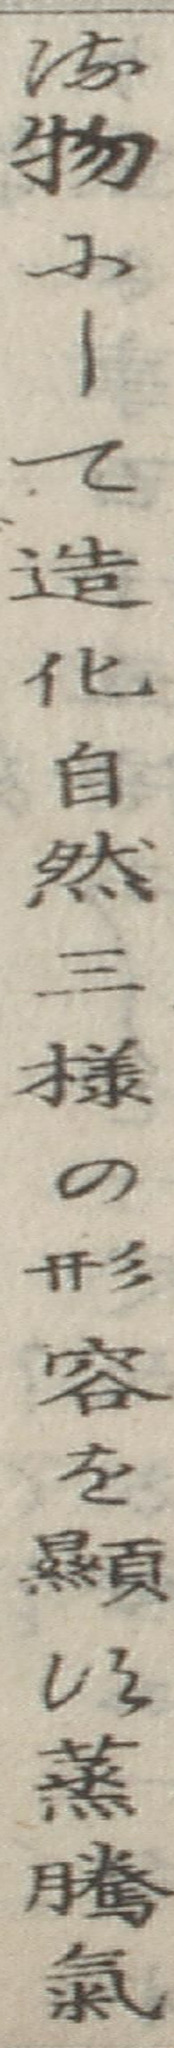る物にして造化自然三様の形容を顕す蒸騰気
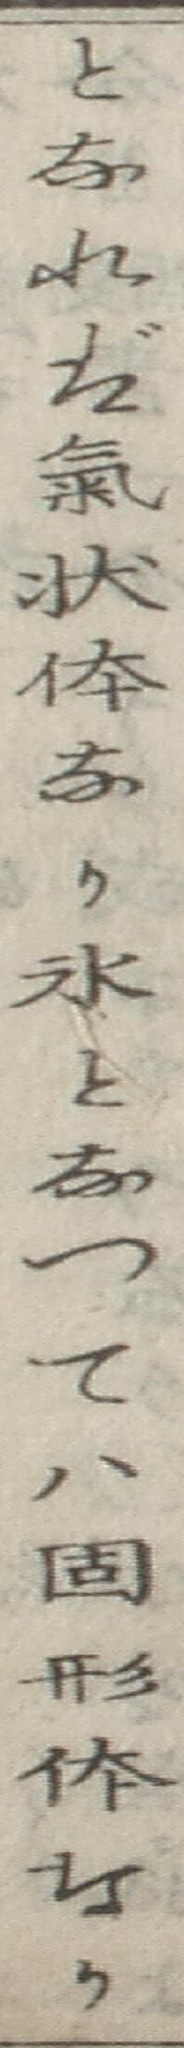となれば気状体なり氷となつては固形体なり
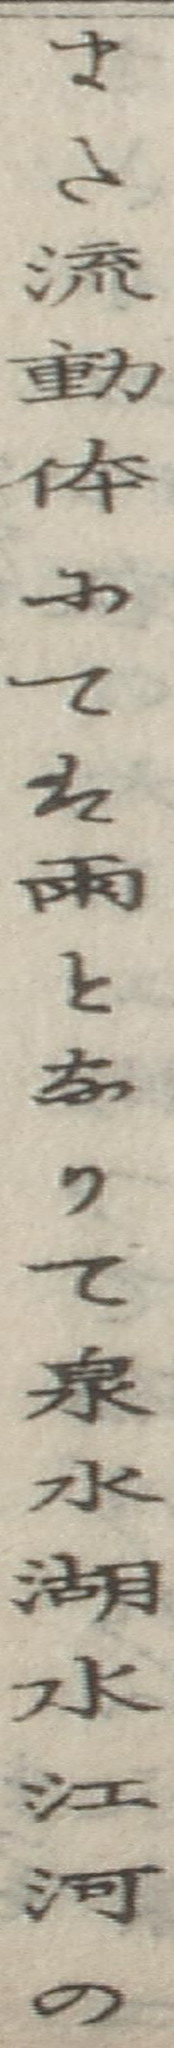また流動体にては雨となりて泉水湖水江河の
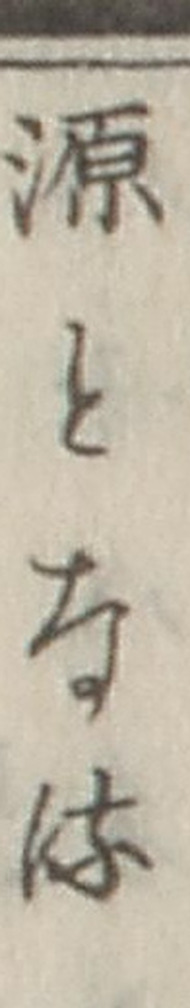源となる
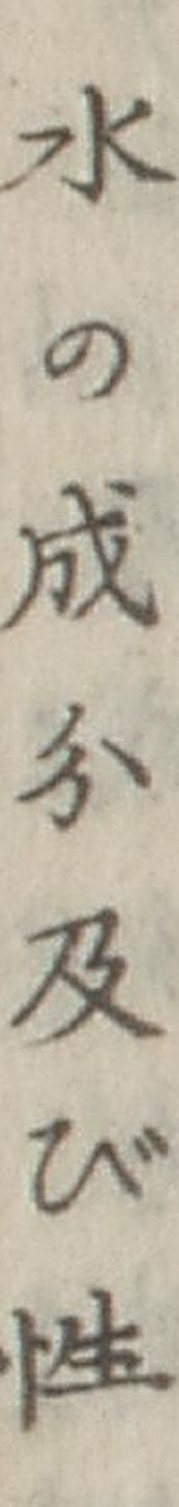水の成分及び性

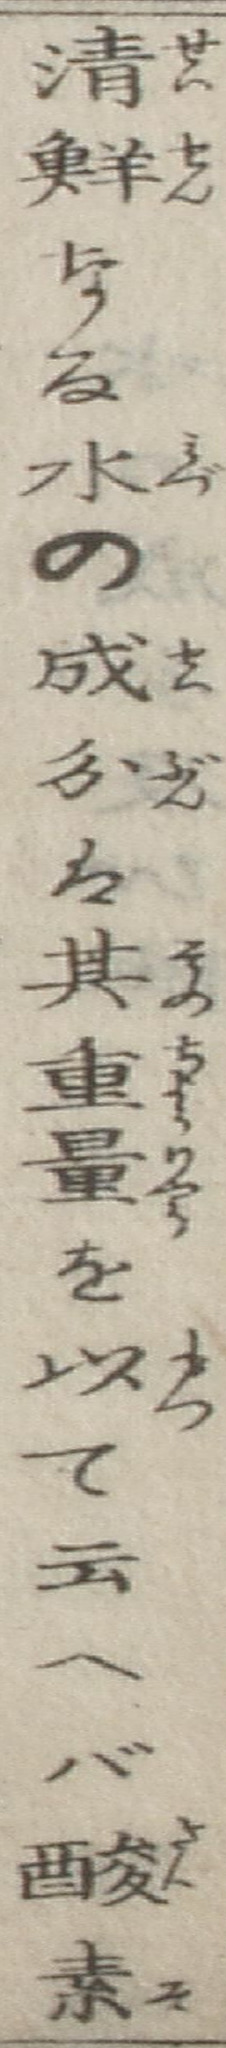清鮮なる水の成分は其重量を以て云へば酸素
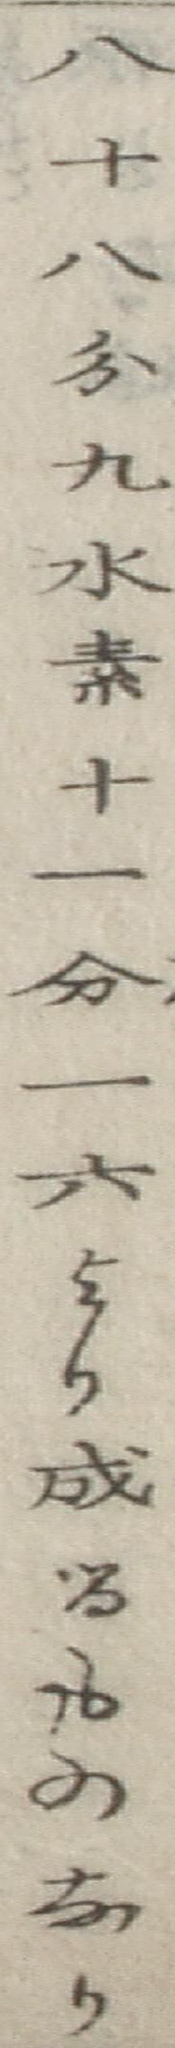八十八分九水素十一分一六より成るものなり
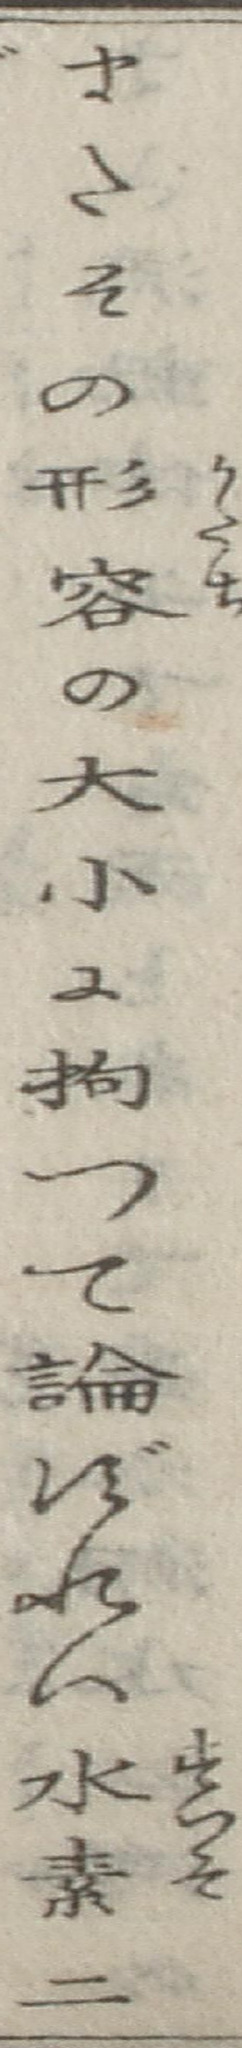またその形容の大小に拘つて論ずれは水素二
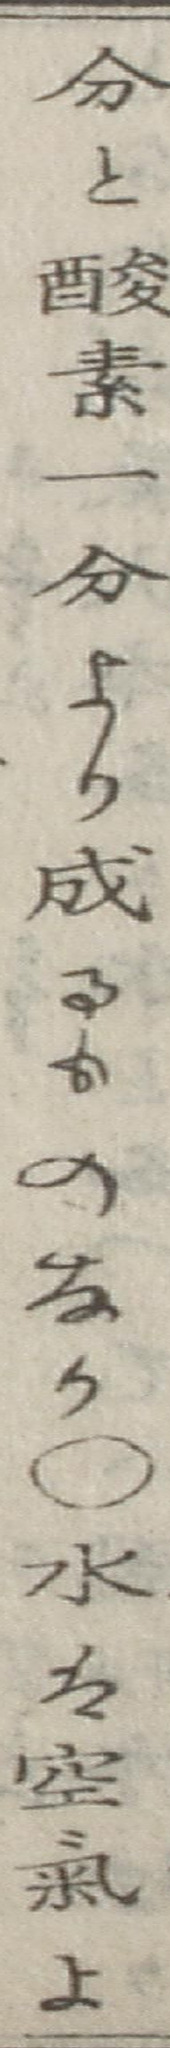分と酸素一分より成るものなり〇水は空気よ
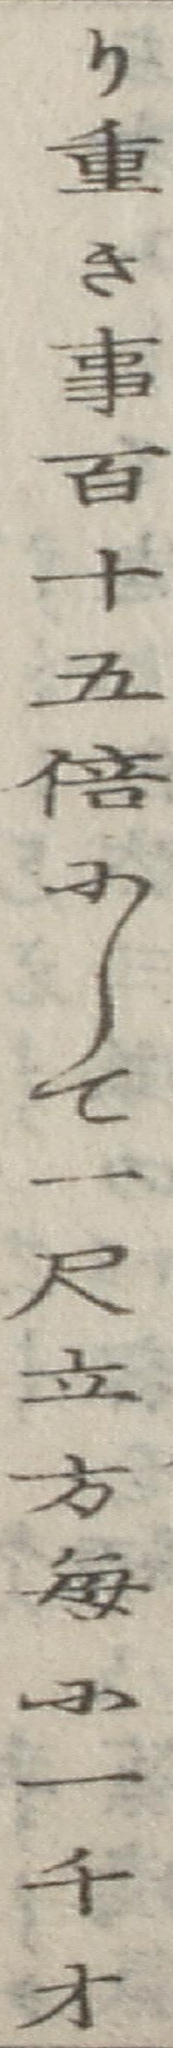り重き事百十五倍にして一尺立方毎に一千オ
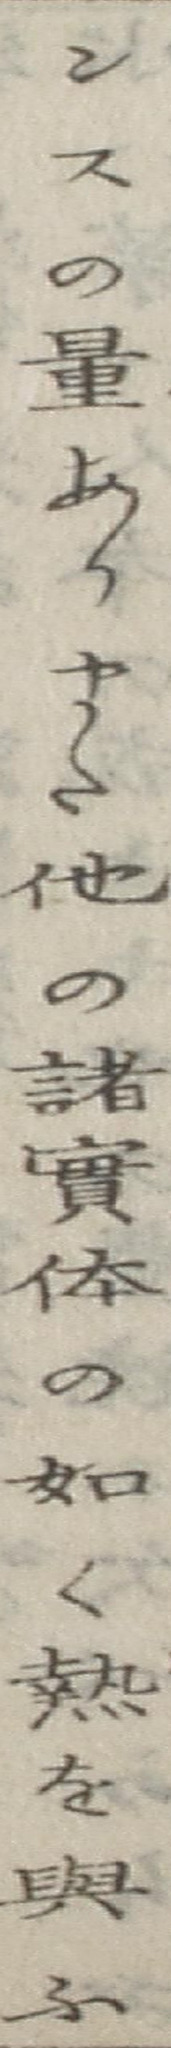ンスの量ありまた他の諸実体の如く熱を与ふ
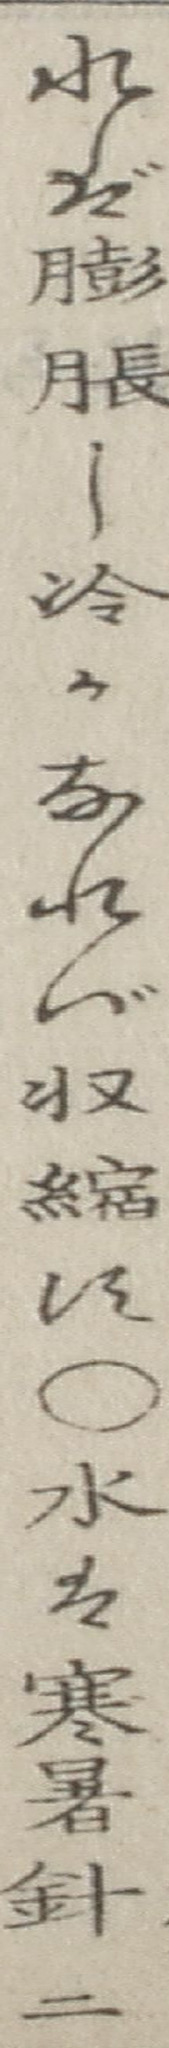れば膨脹し冷かなれば収縮す〇水は寒暑針二
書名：訓蒙　天然地理學　中
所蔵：東京大学地震研究所図書室 Earthquake Research Institute Library, The University of Tokyo, JAPAN
